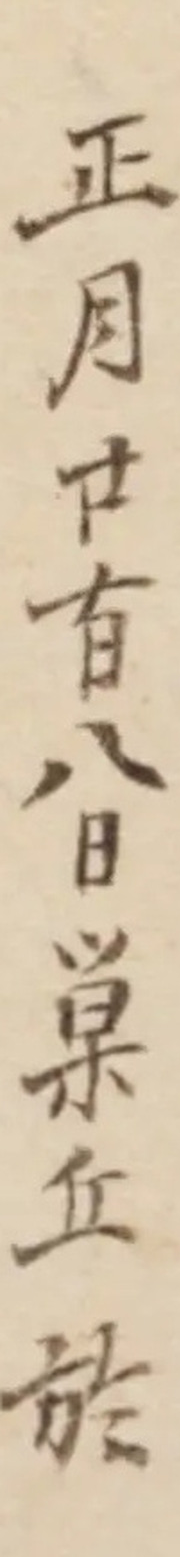正月廿有八日巣丘於

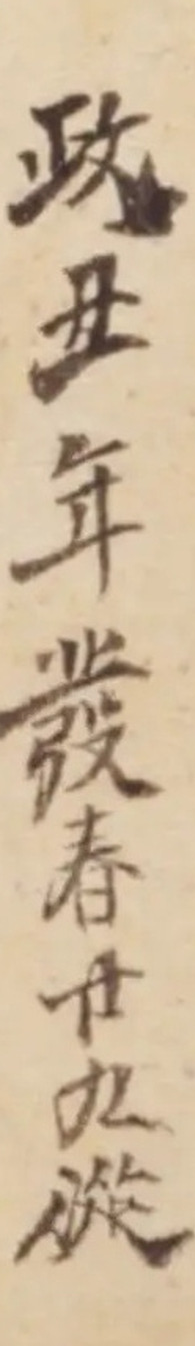政丑年發春廿九
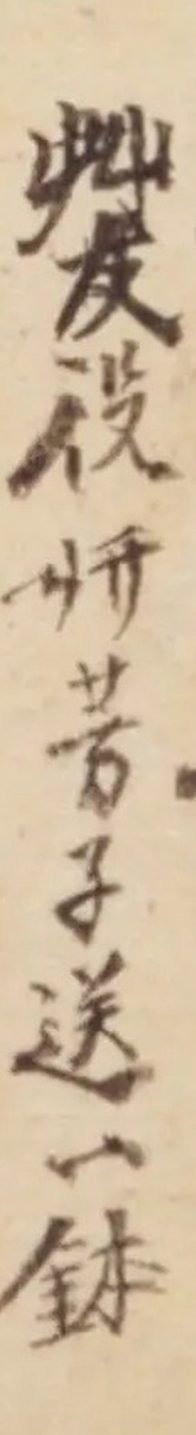艸友妍芳子送一鉢
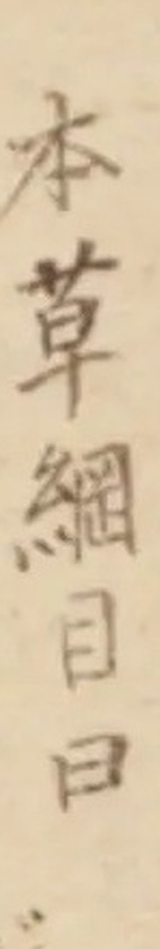本草綱目曰

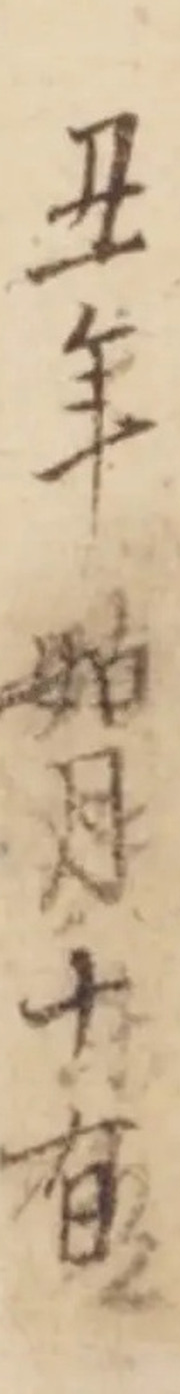丑年如月十有
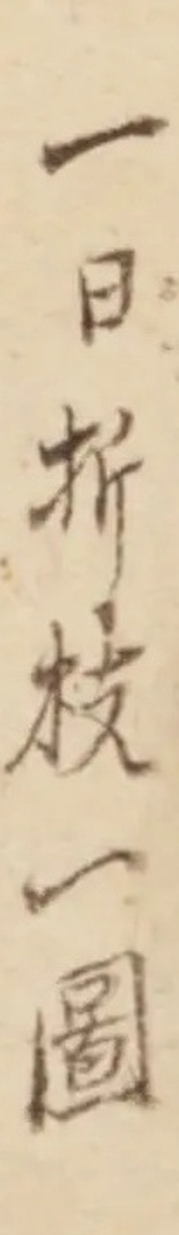一日折枝一圖
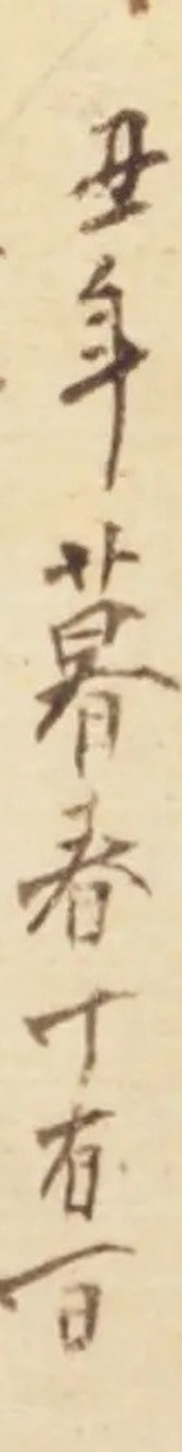丑年暮春十有一日
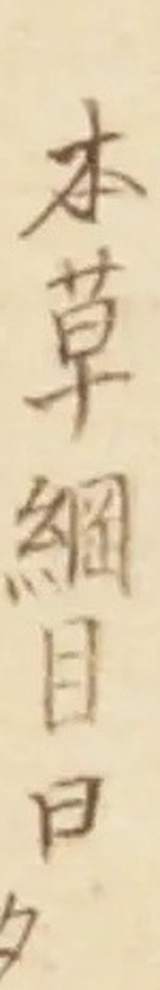本草綱目曰
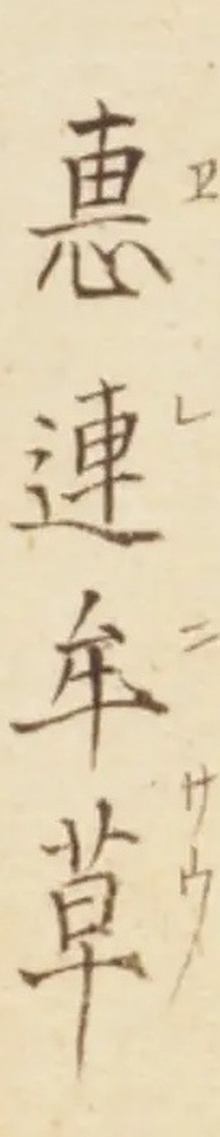恵連牟草

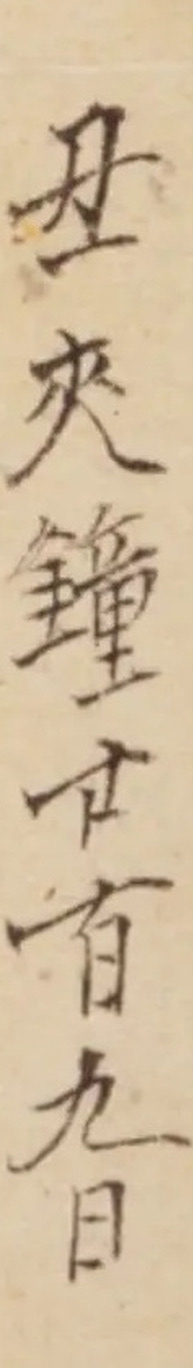丑夾鐘廿有九日
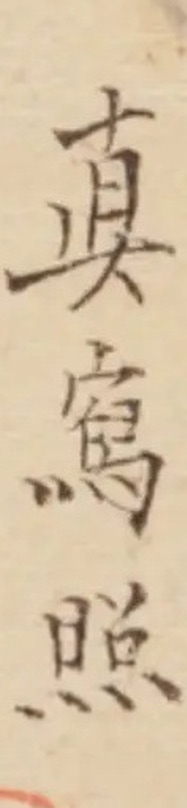真寫照

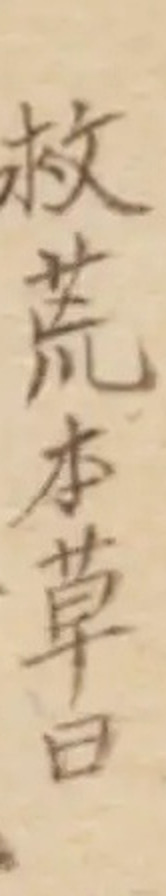救荒本草曰
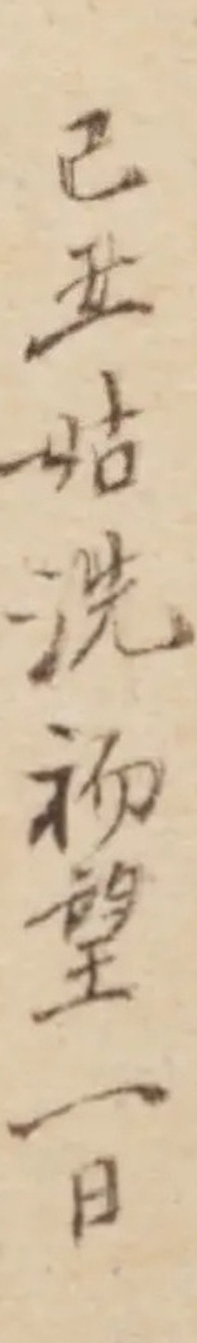丑年姑洗初望一日
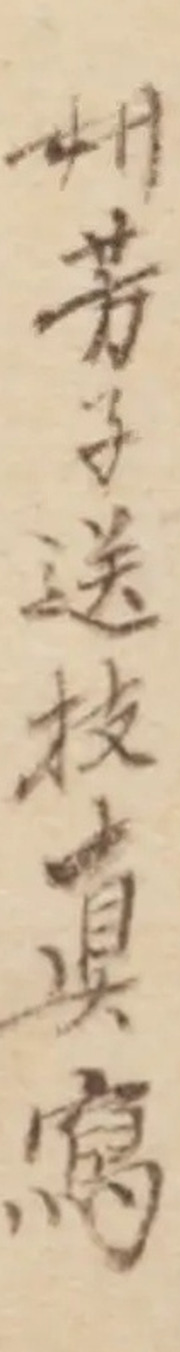妍芳子送枝真寫

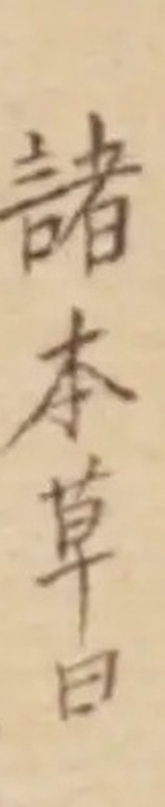諸本草曰
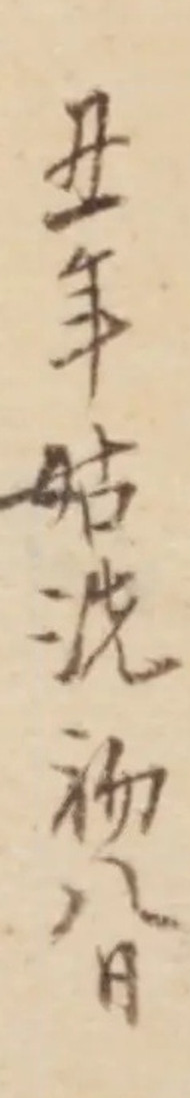丑年姑洗初八日
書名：梅園草木花譜春之部. 4
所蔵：国立国会図書館 National Diet Library, JAPAN
